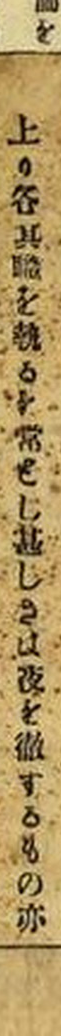上り各其職を執るを常とし甚しきは夜を徹するもの亦
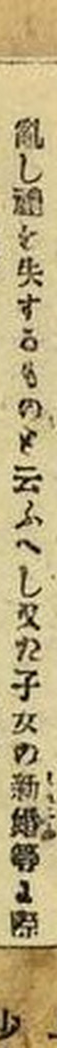乱し礼を失するものと云ふへし又た子女の新婚等に際
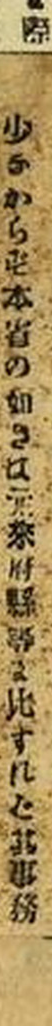少なからず本省の如きは元来府県等に比すれば其事務
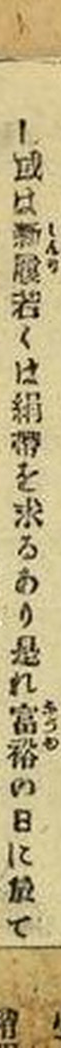し或は新履若くは絹帯を求るあり是れ富裕の日に於て
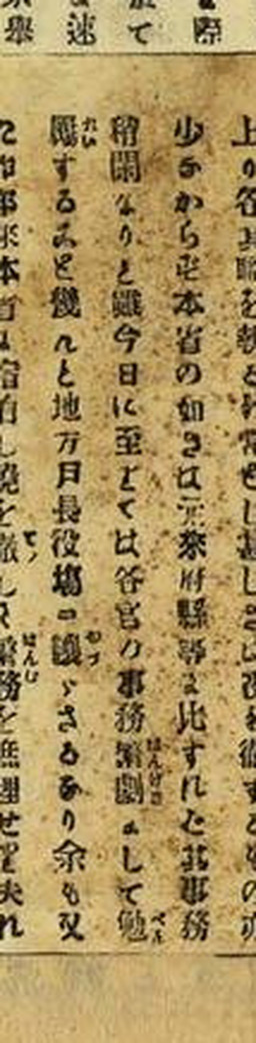稍閑なりと雖今日に至りては各官の事務繁劇にして勉
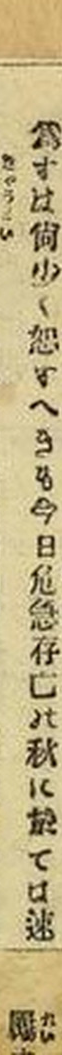為すは尚少く恕すへきも今日危急存亡の秋に於ては速
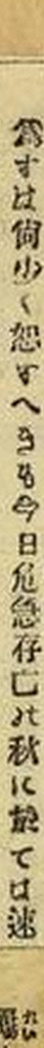為すは尚少く恕すへきも今日危急存亡の秋に於ては速
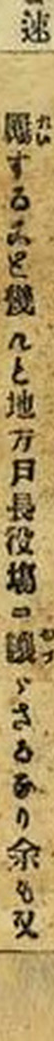励すること幾んと地方戸長役場に譲らさるなり余も又
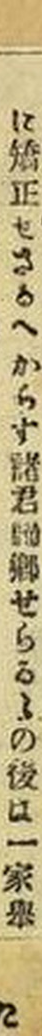に矯正せさるへからす諸君帰郷せらるゝの後は一家挙
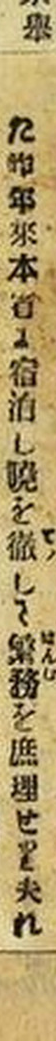た昨年来本省に宿泊し暁を徹して繁務を庶理せり夫れ
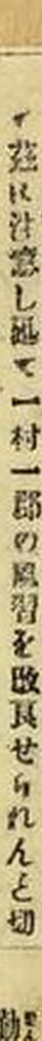て茲に注意し延て一村一郡の風習を改良せられんと切
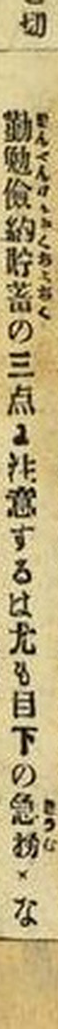勤勉倹約貯蓄の三点に注意するは尤も目下の急務とな
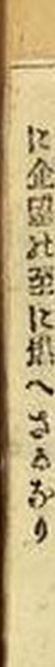に企望の至に堪へさるなり
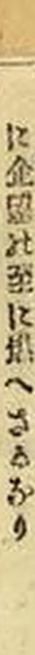に企望の至に堪へさるなり
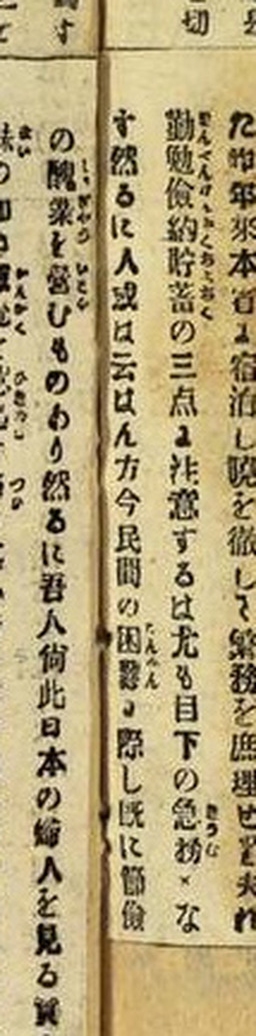す然るに人或は云はん方今民間の困難に際し既に節倹
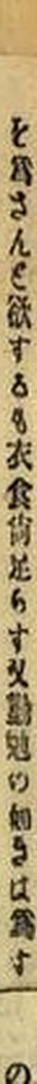を為さんと欲するも衣食尚足らす又勤勉の如きは為す
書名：温古集 五巻
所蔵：福井県文書館 Fukui Prefectural Archives
